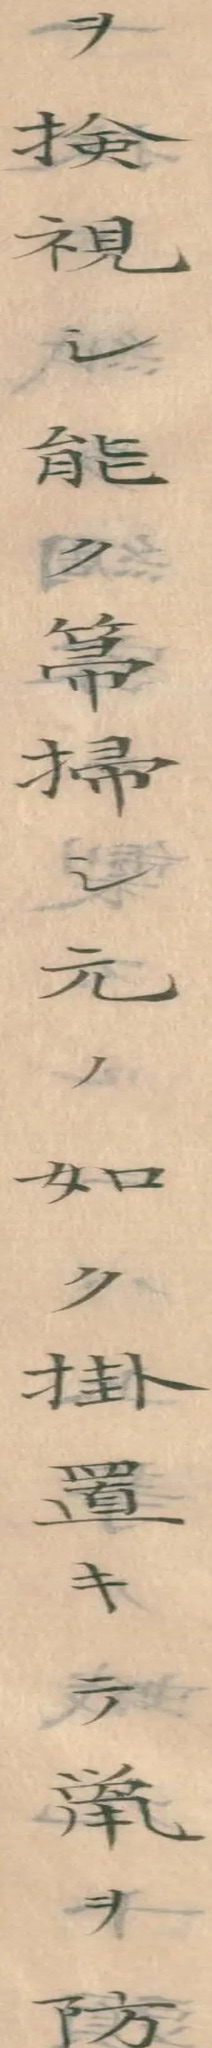ヲ検視シ能ク箒掃シ元ノ如ク掛置キテ鼠ヲ防
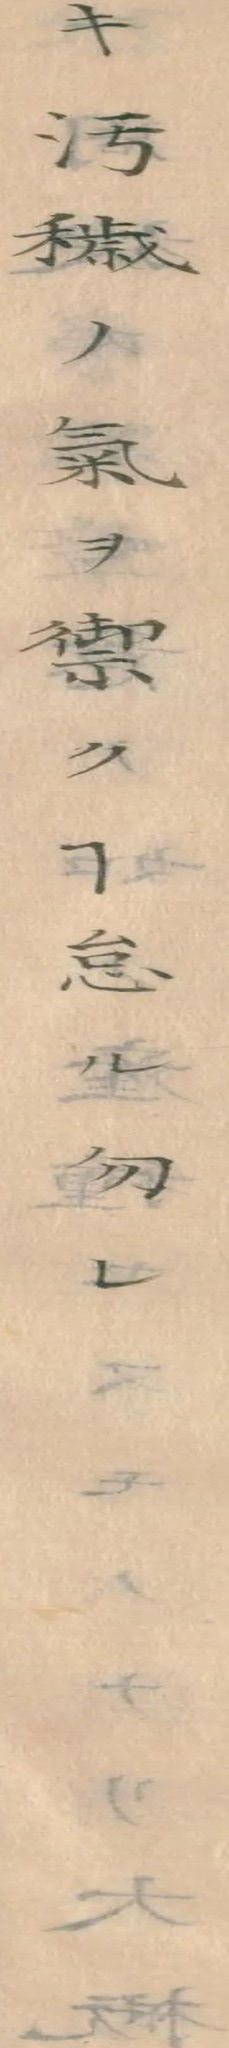キ汚穢ノ気ヲ禦クコト怠ル勿レ
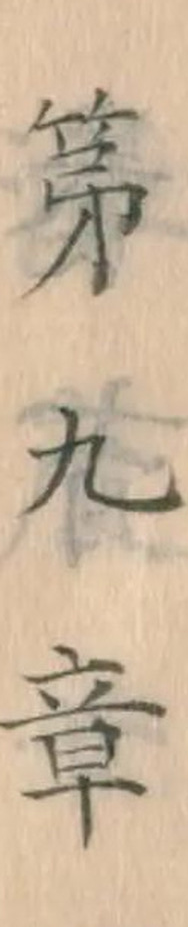第九章
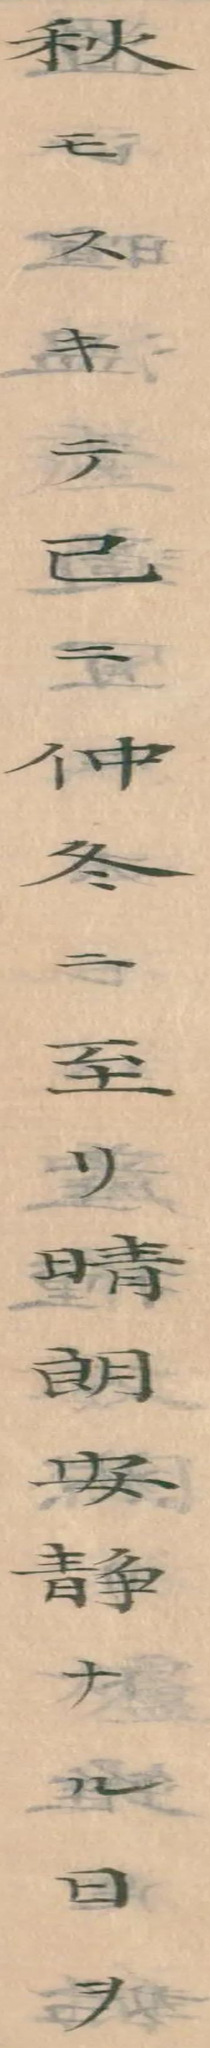秋モスキテ已ニ仲冬ニ至リ晴朗安静ナル日ヲ
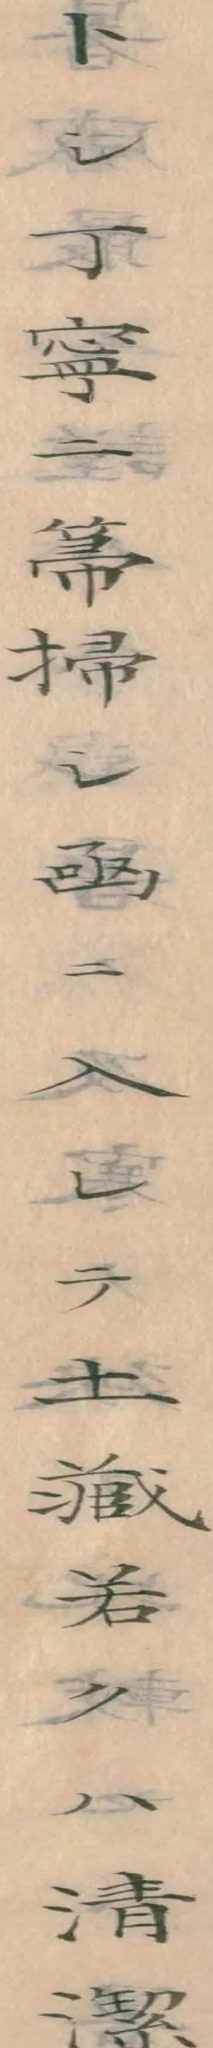卜シ丁寧ニ箒掃シ凾ニ入レテ土蔵若クハ清潔
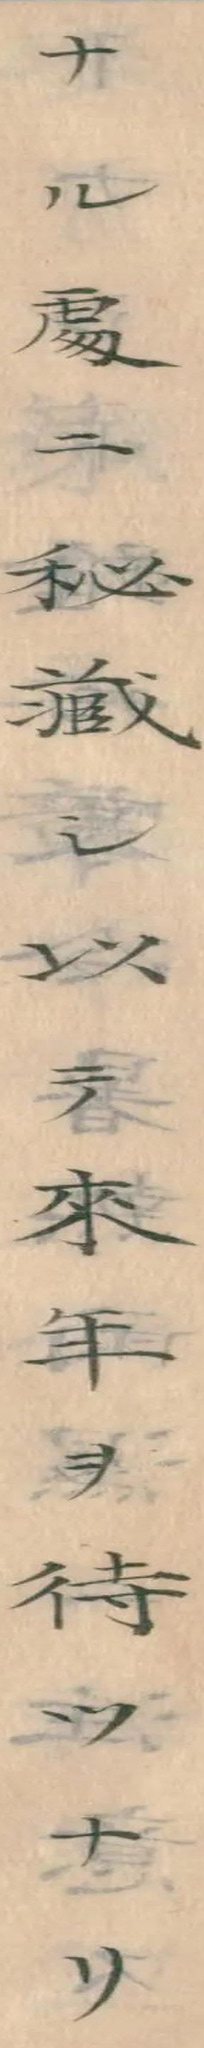ナル処ニ秘蔵シ以テ来年ヲ待ツナリ
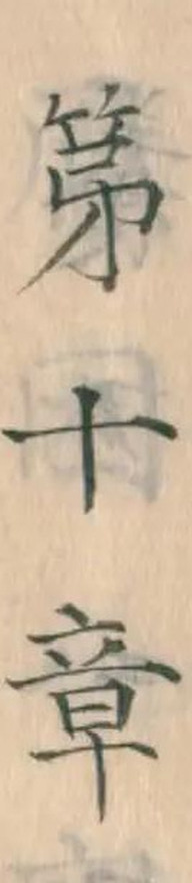第十章
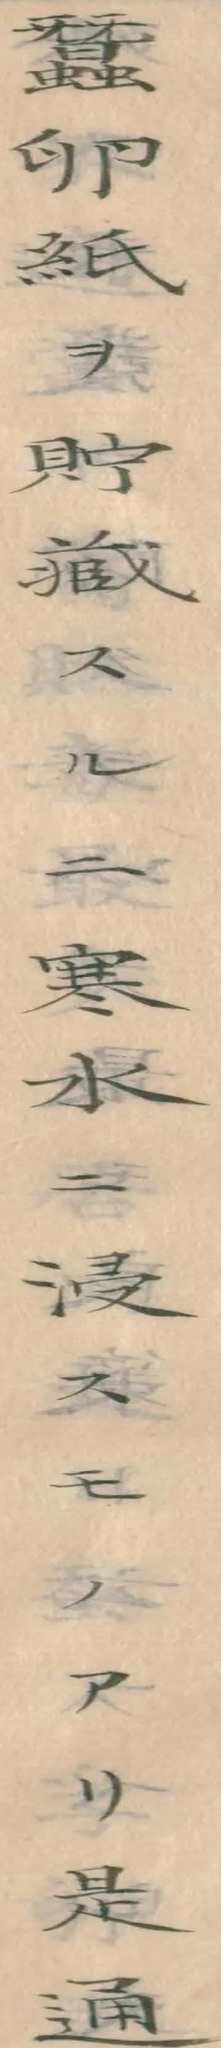蚕卵紙ヲ貯蔵スルニ寒水ニ浸スモノアリ是通
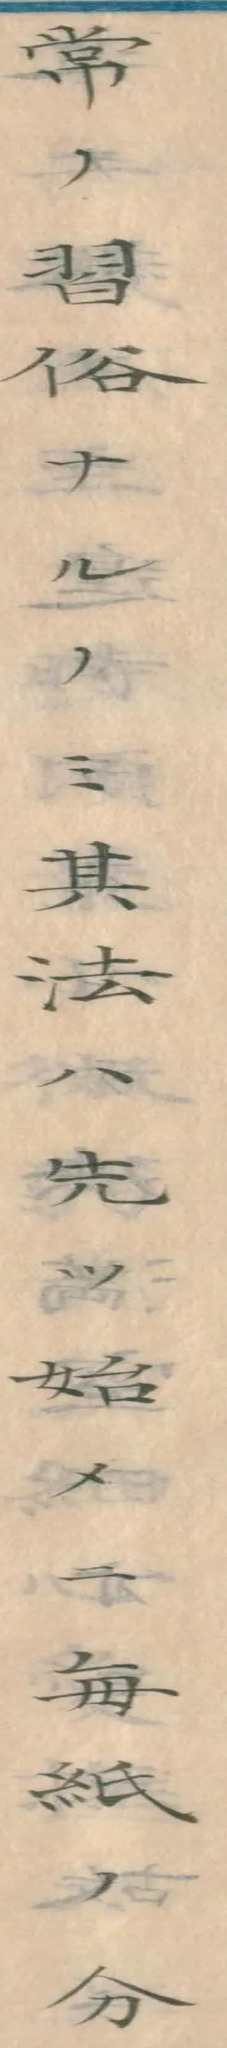常ノ習俗ナルノミ其法ハ先ツ始メニ毎紙ノ分
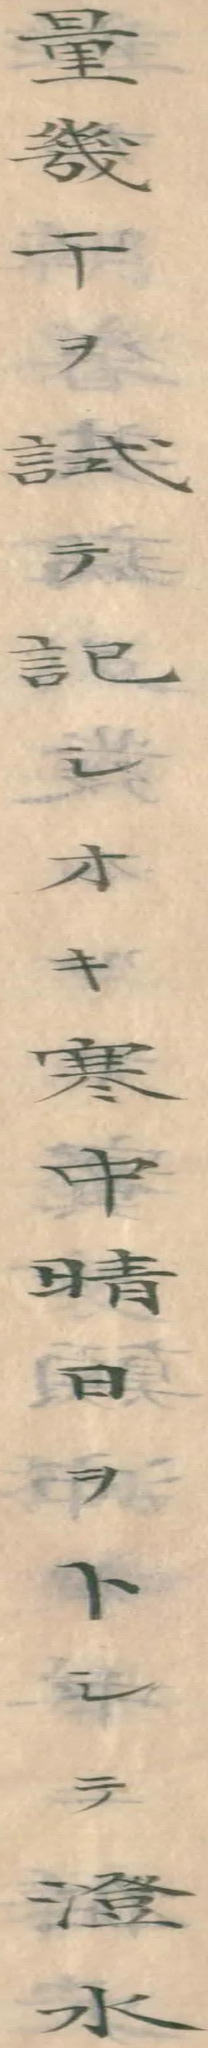量幾千ヲ試テ記シオキ寒中晴日ヲ卜シテ澄水
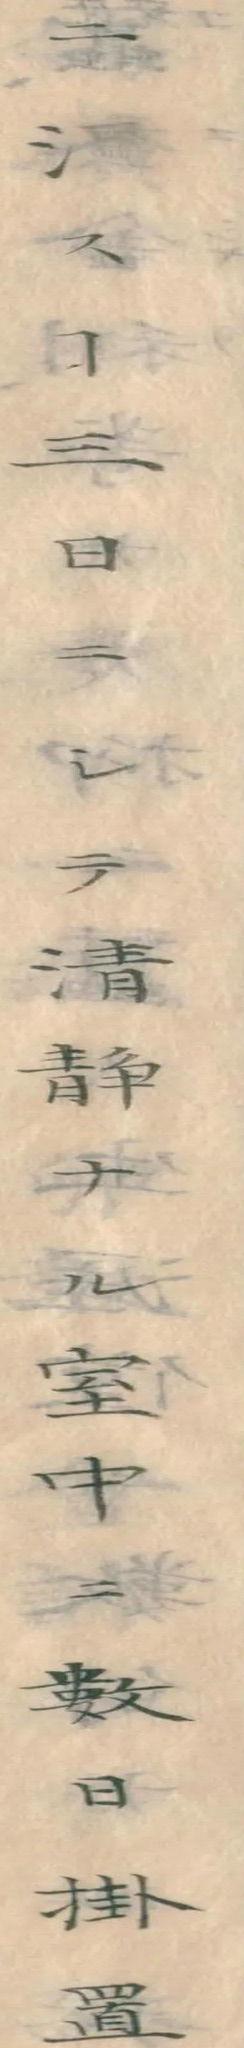ニ氵スコト三日ニシテ清静ナル室中ニ数日掛置
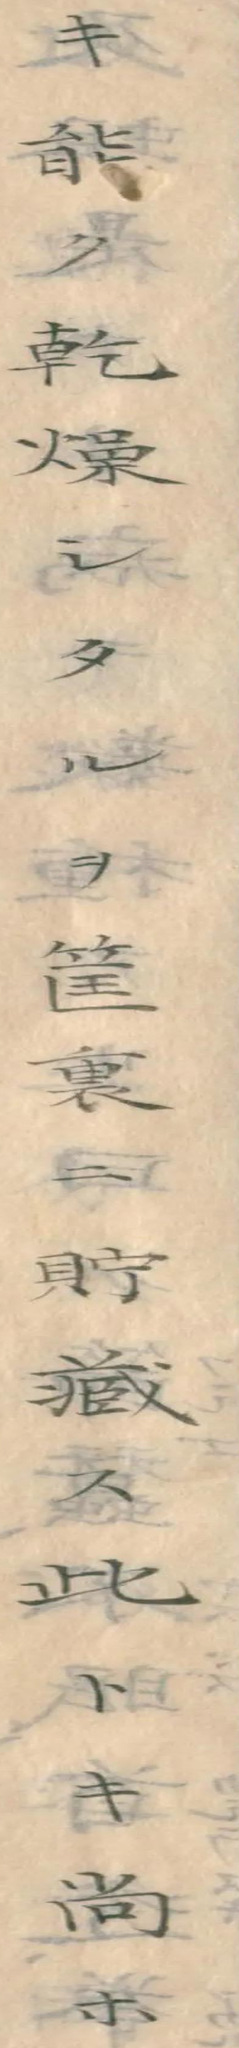キ能ク乾燥シタルヲ筐裏ニ貯蔵ス此トキ尚ホ
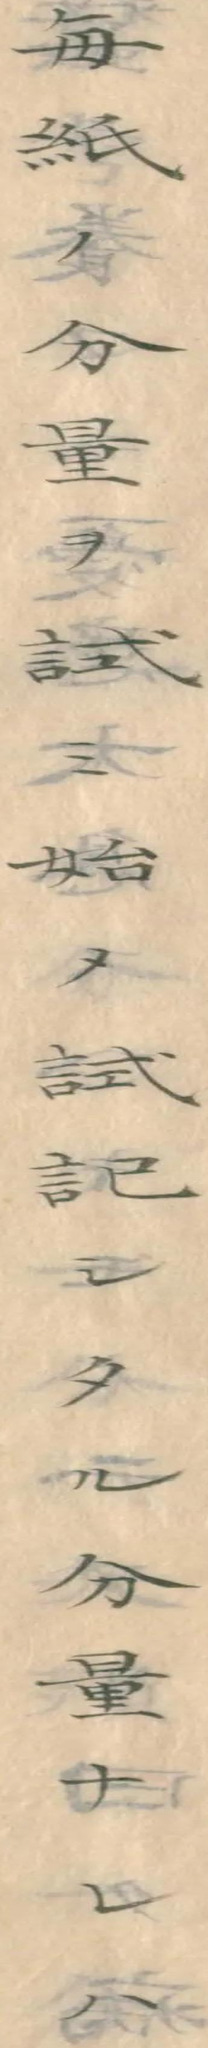毎紙ノ分量ヲ試ミ始メ試記シタル分量ナレハ
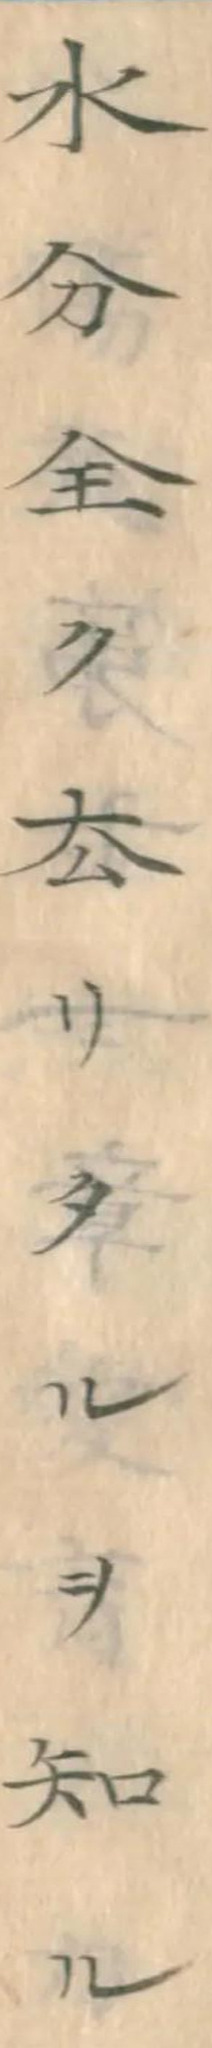水分全ク去リタルヲ知ル

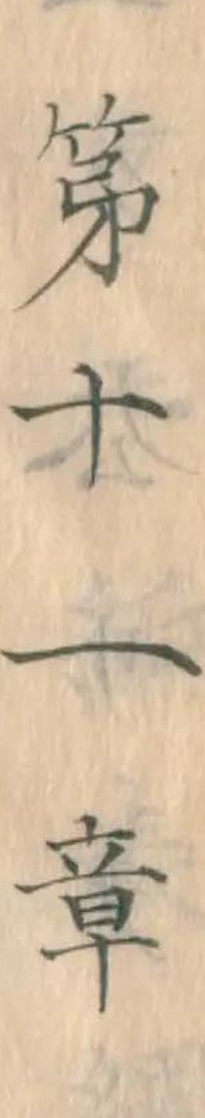第十一章
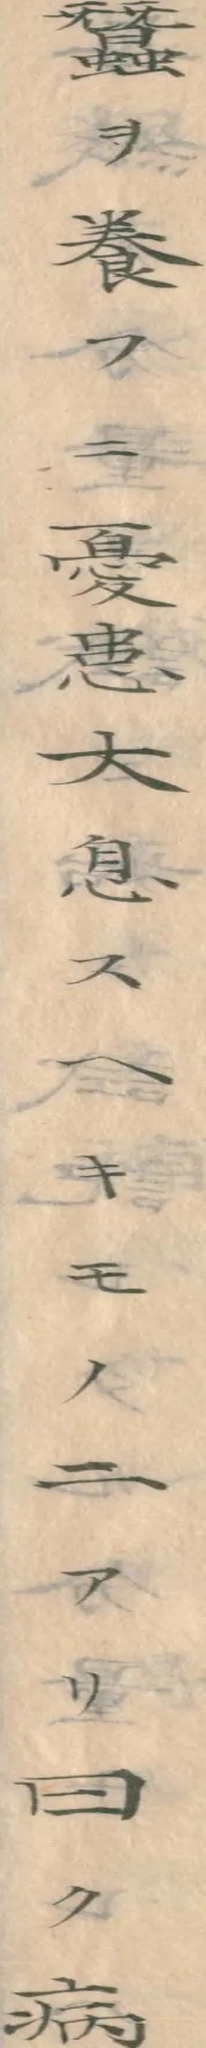蚕ヲ養フニ憂患大息スヘキモノ二アリ曰ク病
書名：蚕桑集成
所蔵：国立国会図書館 National Diet Library, JAPAN
